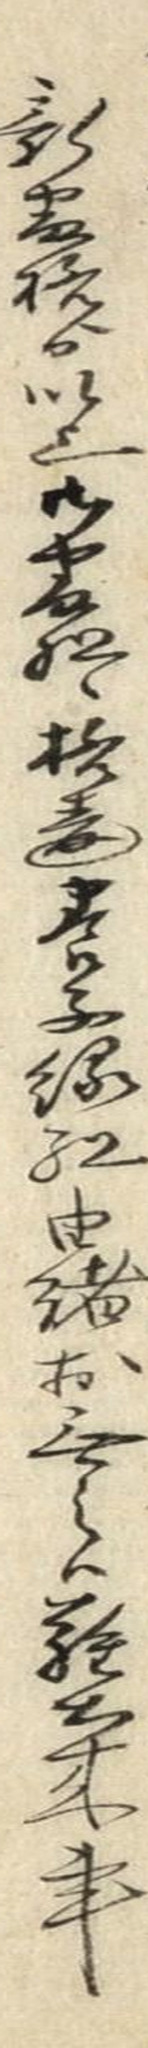新番格ゟ以上御番組へ格違養子縁組由緒於無之ハ難出来事
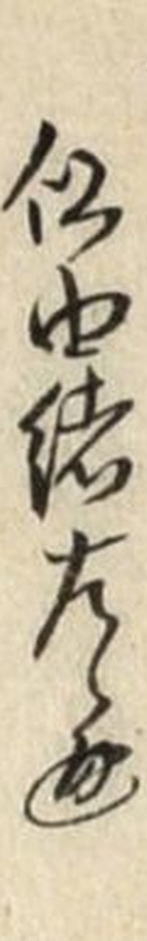但由緒左之通
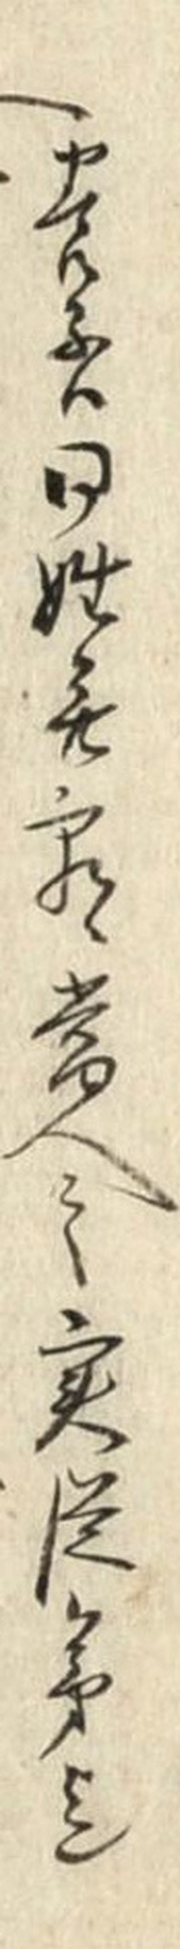与力養子ハ同姓并願候当人之実従弟迄
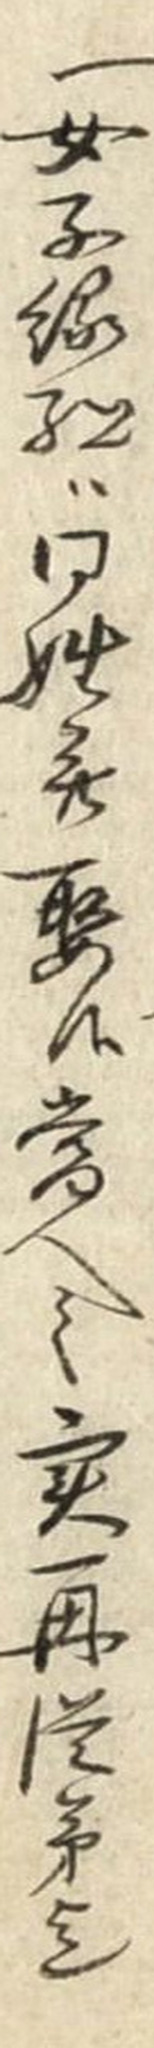女子縁組ハ同姓并娶候当人之実従弟迄
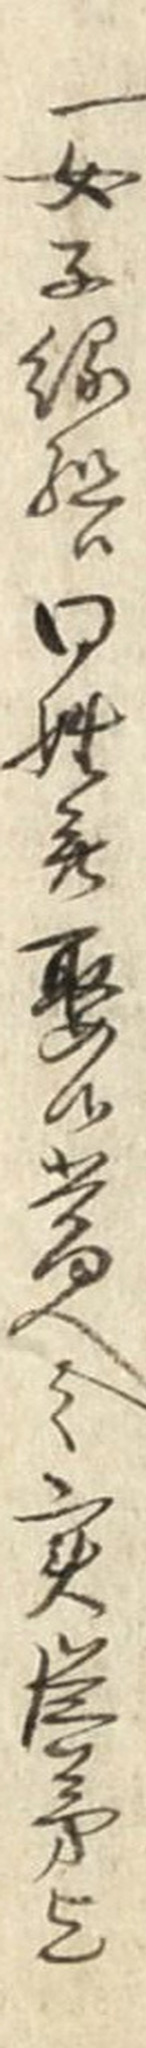女子縁組ハ同姓并娶候当人之実従弟迄
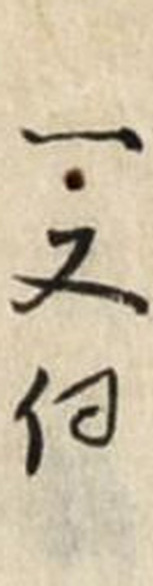一又伺
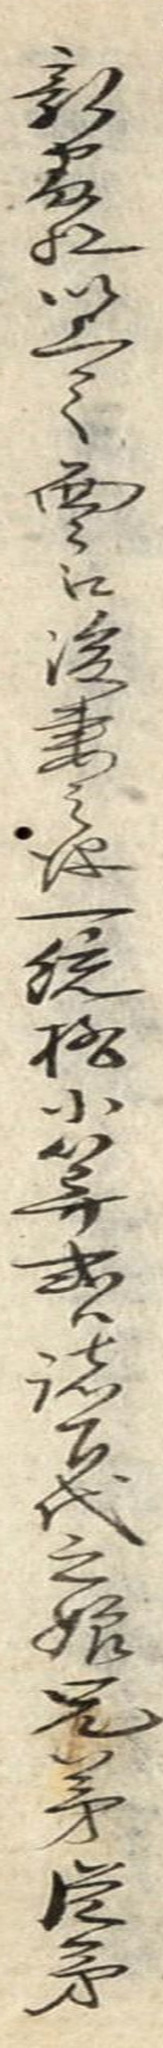新番組以上之面々え後妻之儀一統格小算或ハ諸下代之娘兄弟従弟
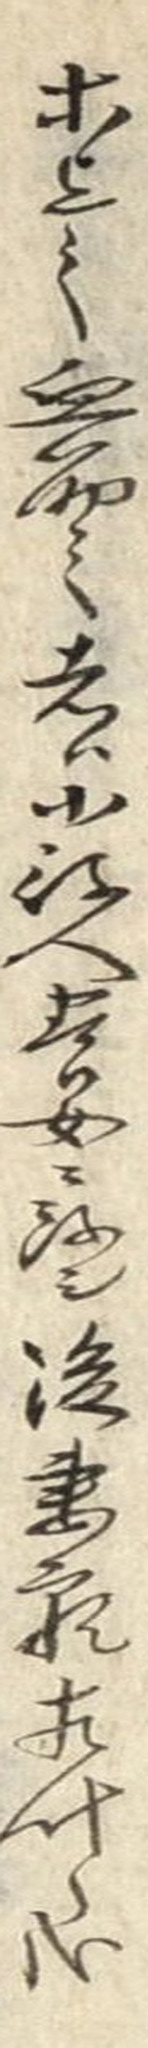等迄之血筋之者ハ小役人養女ニ致シ後妻願相叶候哉

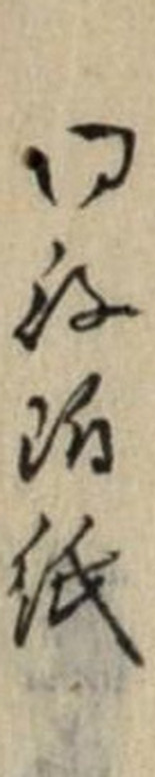同役附紙
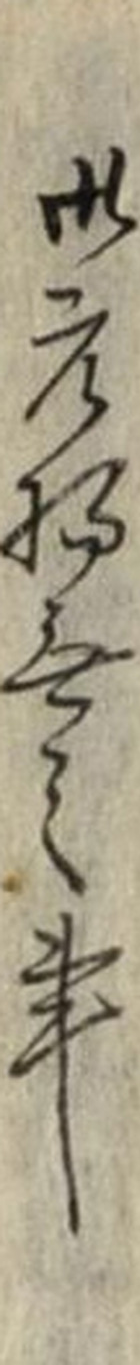御取揚無之事
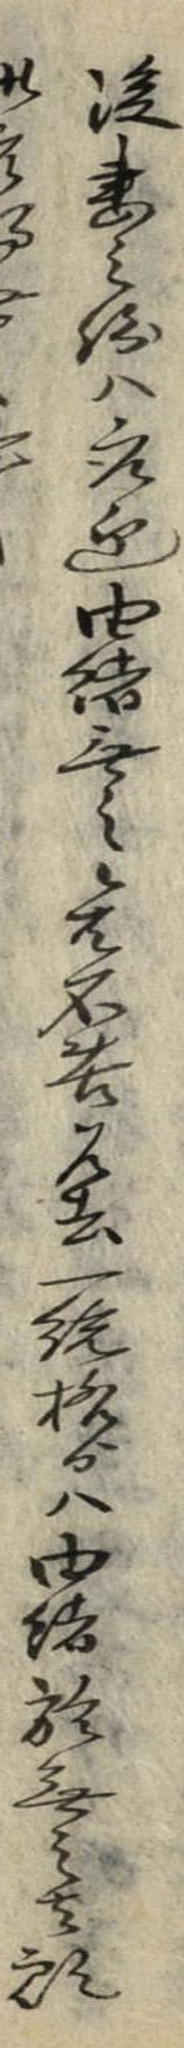後妻之儀ハ取迎由緒無之候共不苦召去一統格ゟハ由緒於無之者願
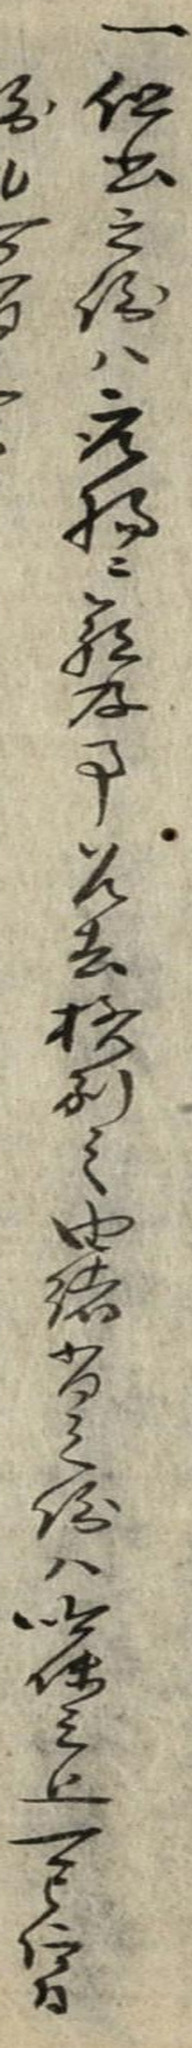一但書之儀ハ取揚ニ難及事召去格別之由緒有之儀ハ吟味之上可被仰付
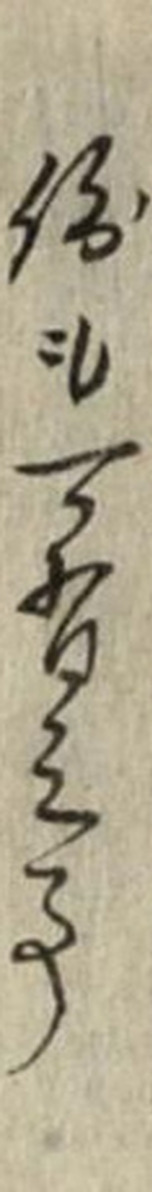儀も可有之事

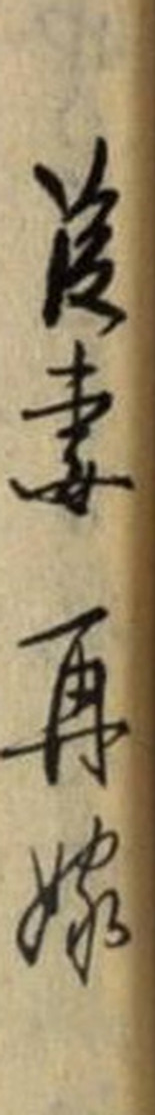後妻再嫁
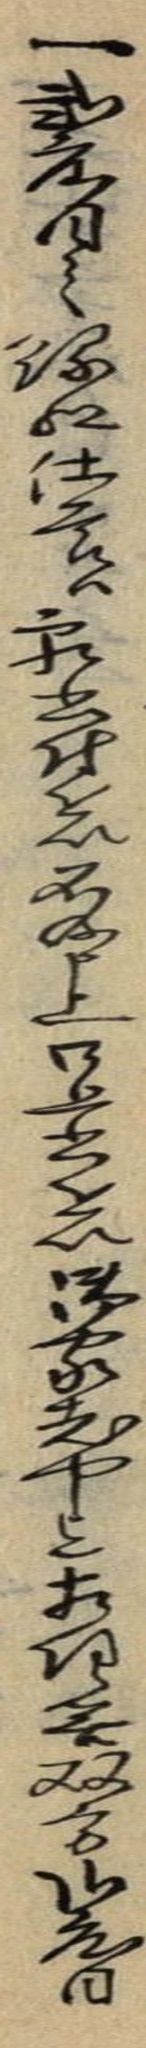一弐度目之縁組仕節ハ願書付を以不及申上口上書を以御家老中迄相伺候筈双方弐度目
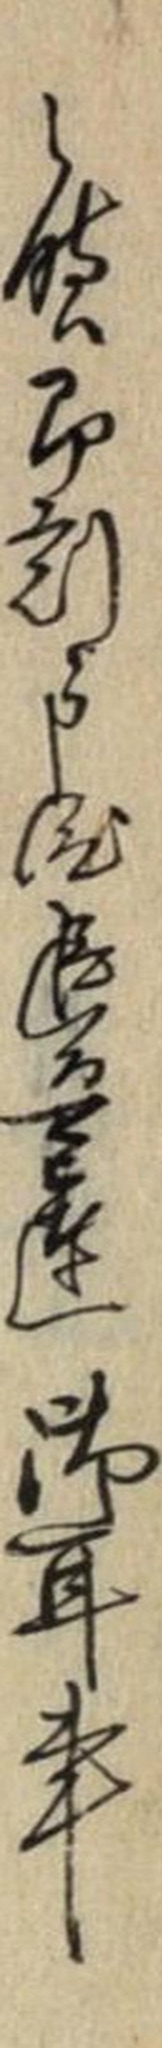之時ハ即刻被申渡追而可被達御耳事
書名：養子縁組之部
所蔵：福井県文書館 Fukui Prefectural Archives
